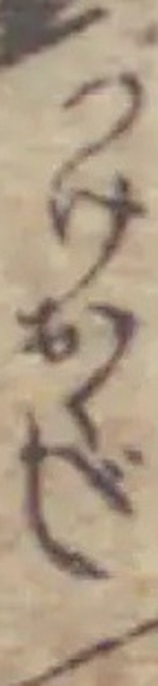つけおくべし
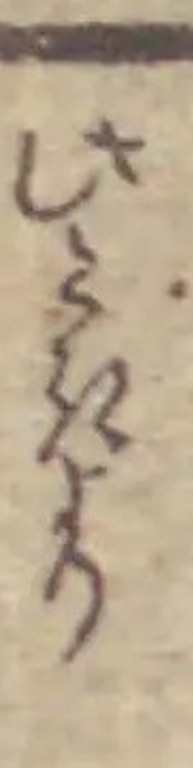此ときより
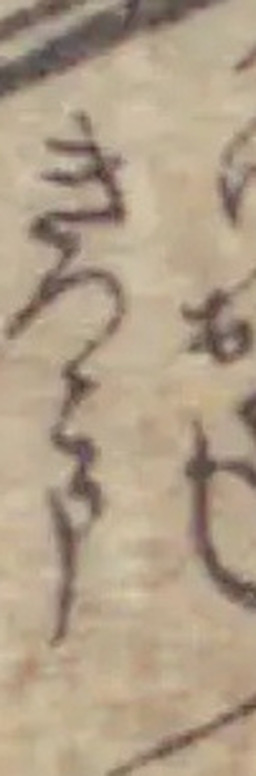きつと申
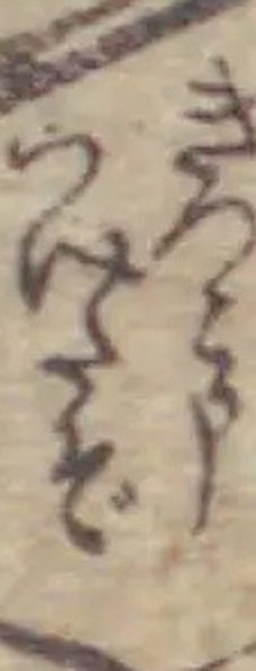つけたぞ
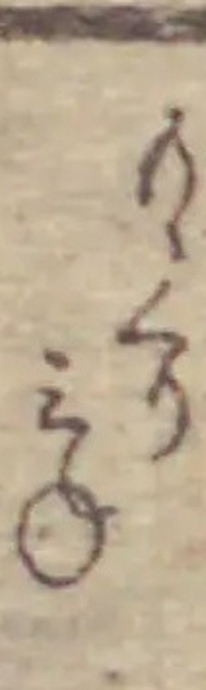もゝくり
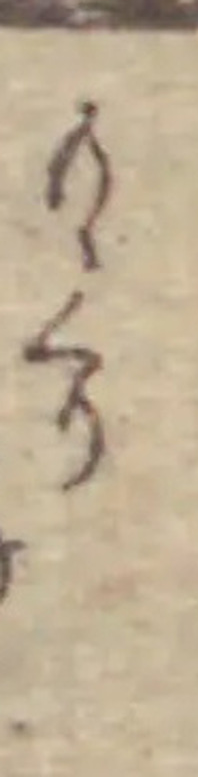もゝくり
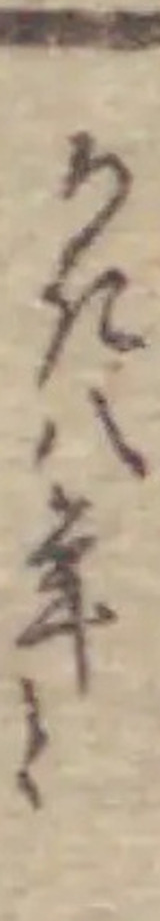かき八年と
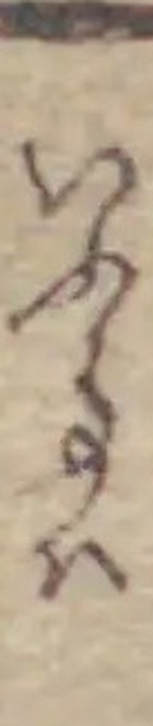いふ事は

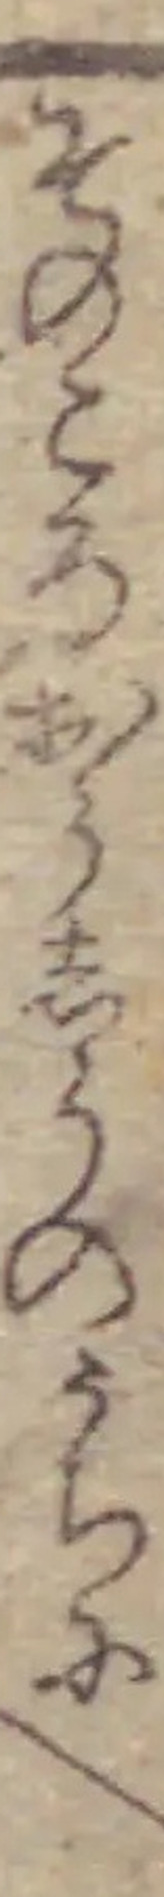そのころおうしうのうちに
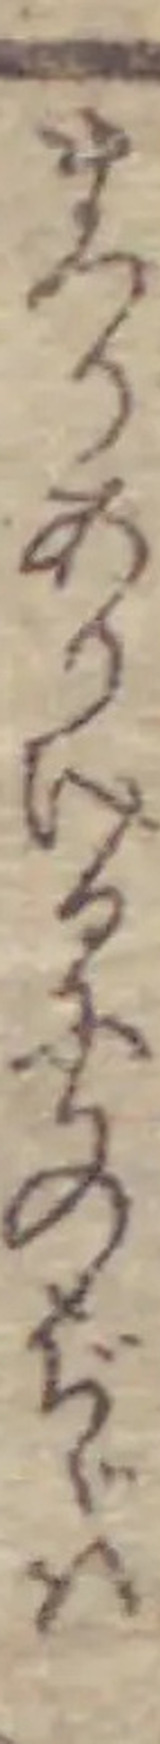まつりありけるにかのばゞは
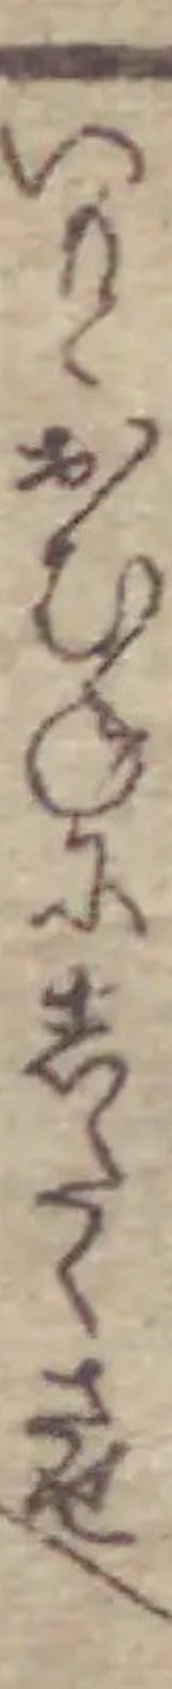いもとおむねにしたくさせ
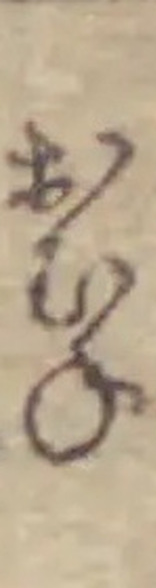おむね
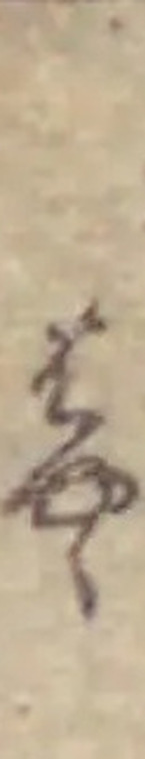はやく
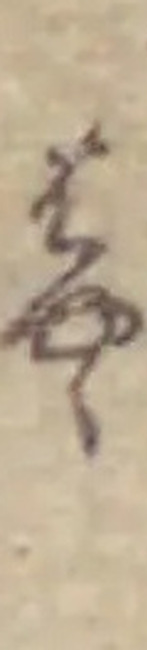はやく
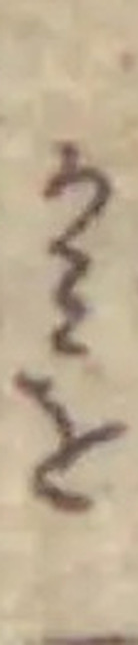かみを
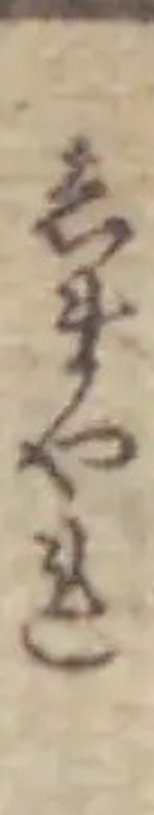しまやれ
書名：奥州咄 3巻
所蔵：国立国会図書館 National Diet Library, JAPAN
